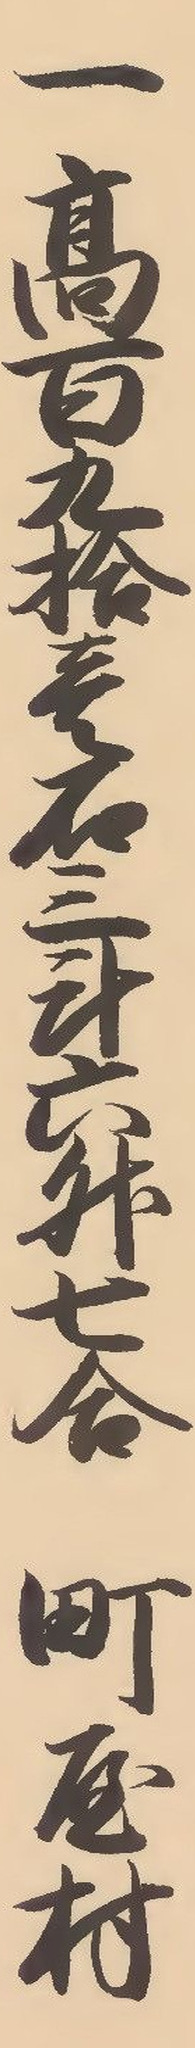一高百九拾壱石三斗六升七合町屋村
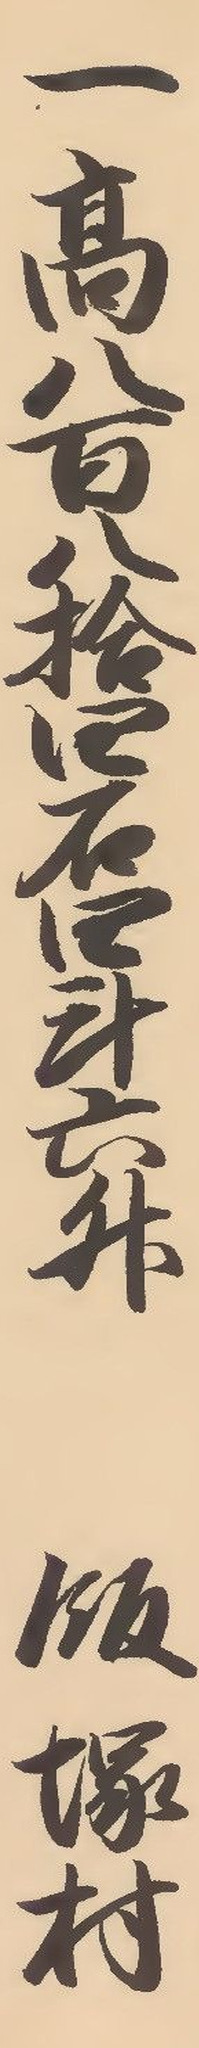一高八百八拾四石四斗六升飯塚村
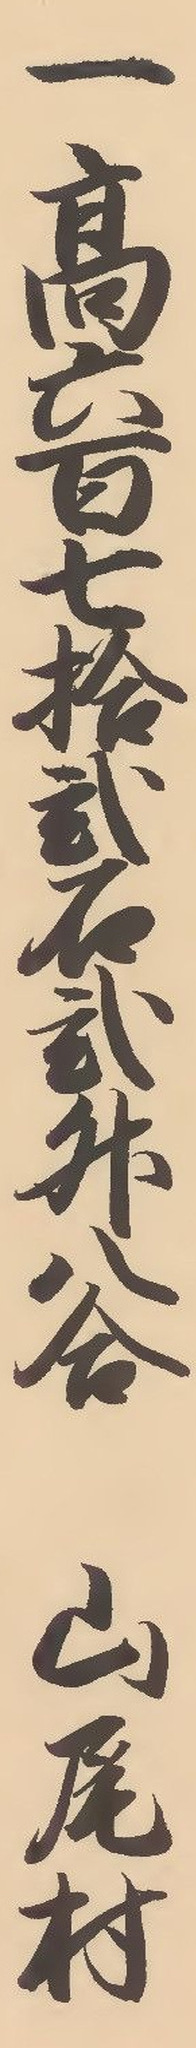一高六百七拾弐石弐升八合山尾村

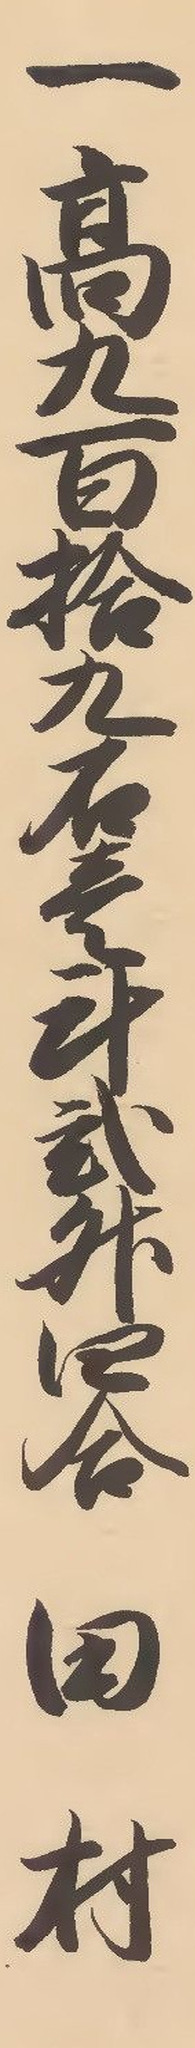一高九百拾九石壱斗弐升四合田村
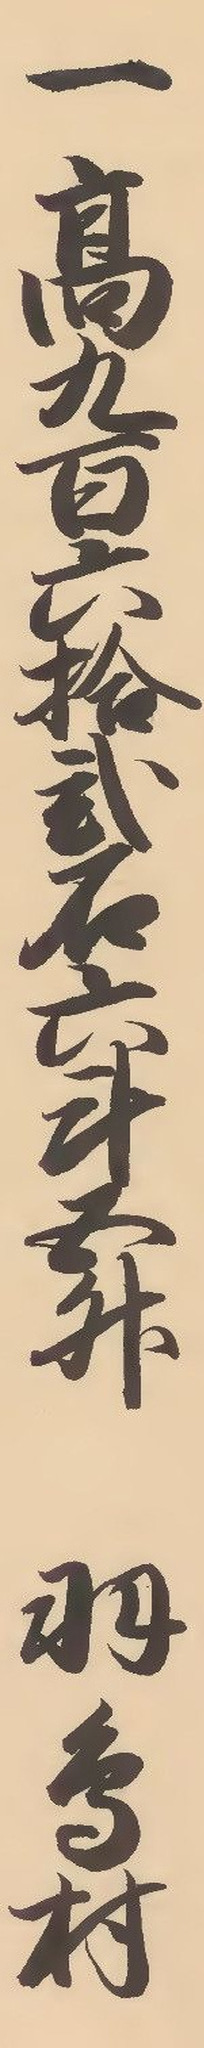一高九百六拾弐石六斗五升羽鳥村
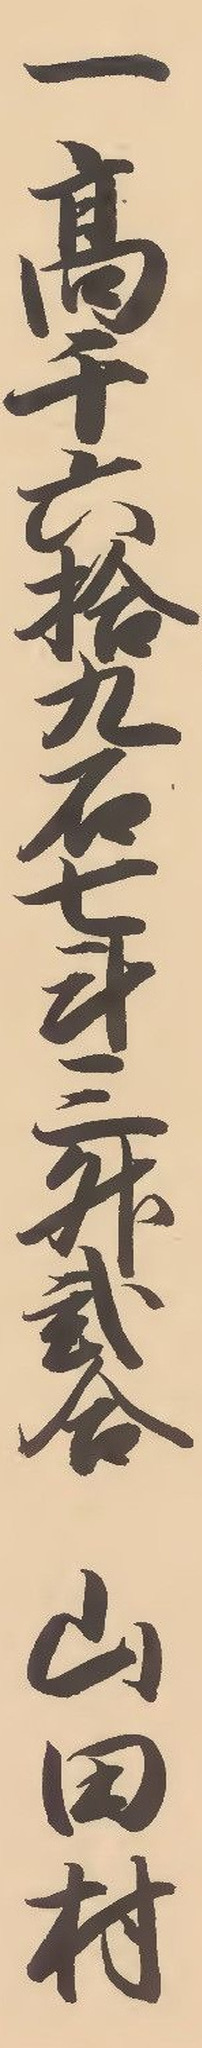一高千六拾九石七斗三升弐合山田村
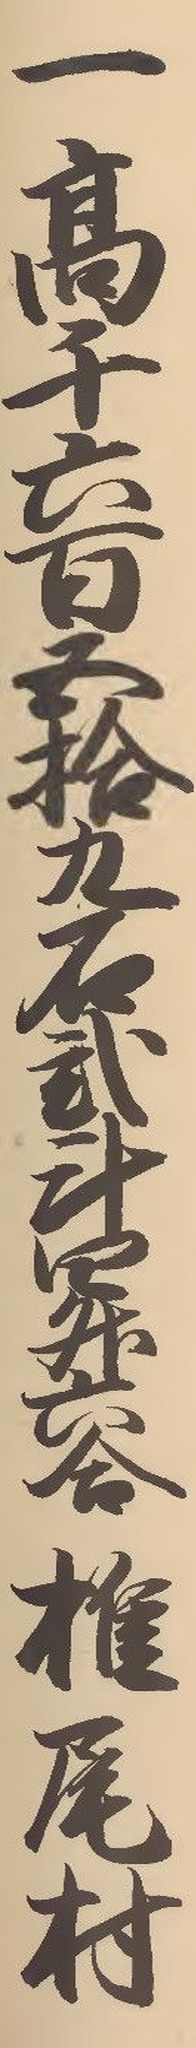一高千六百五拾九石弐斗四升六合椎尾村
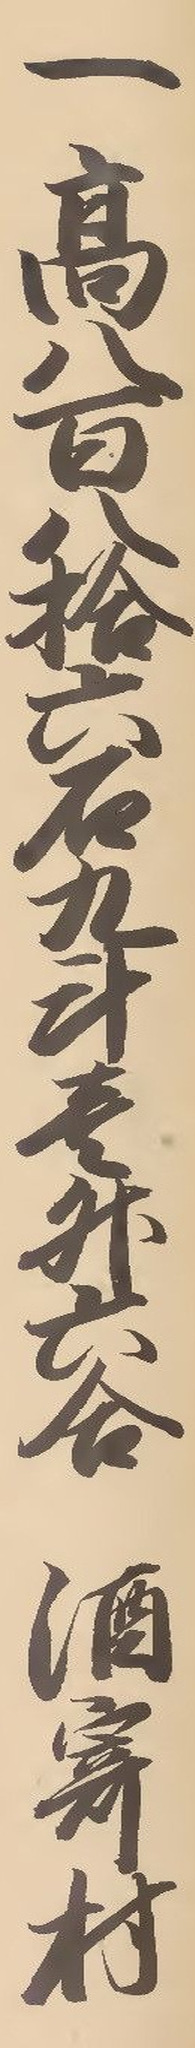一高八百八拾六石九斗壱升六合酒寄村
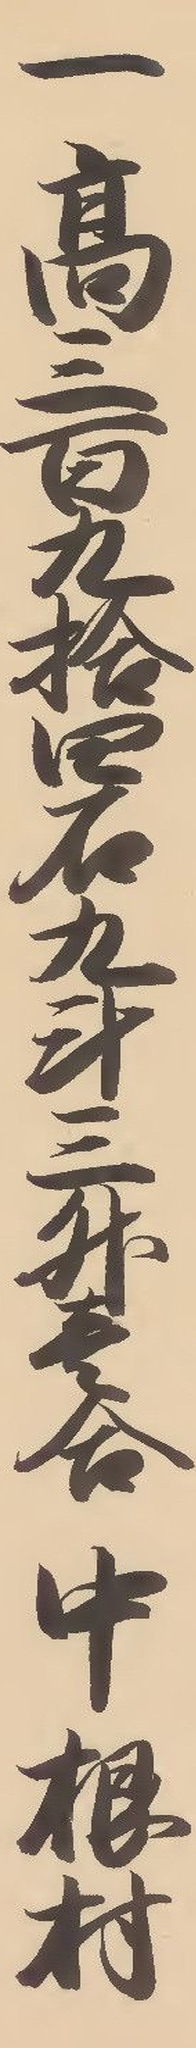一高三百九拾四石九斗三升壱合中根村
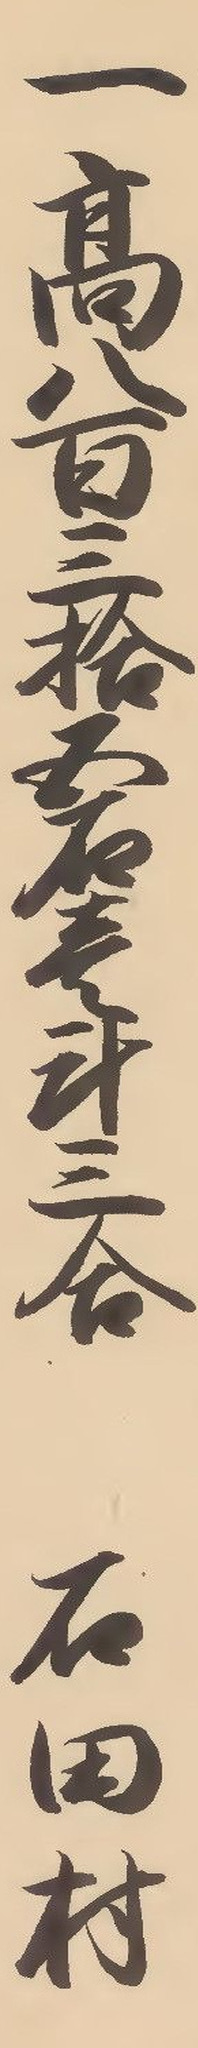一高八百三拾五石壱斗三合石田村
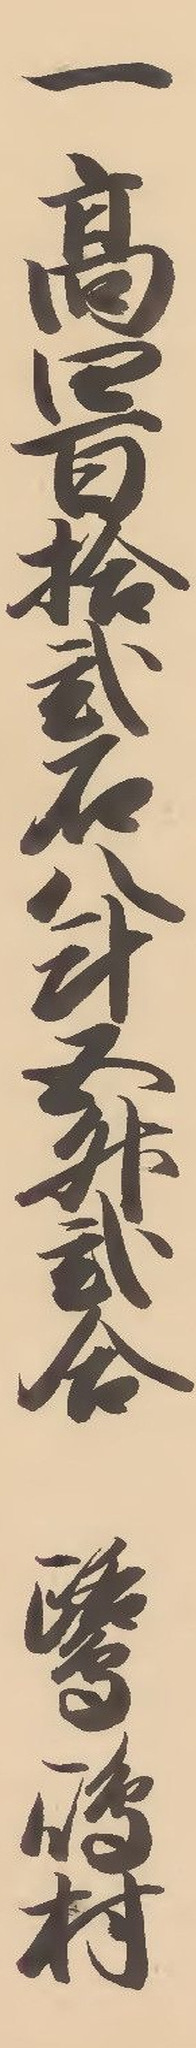一高四百拾弐石八斗五升弐合鷺島村

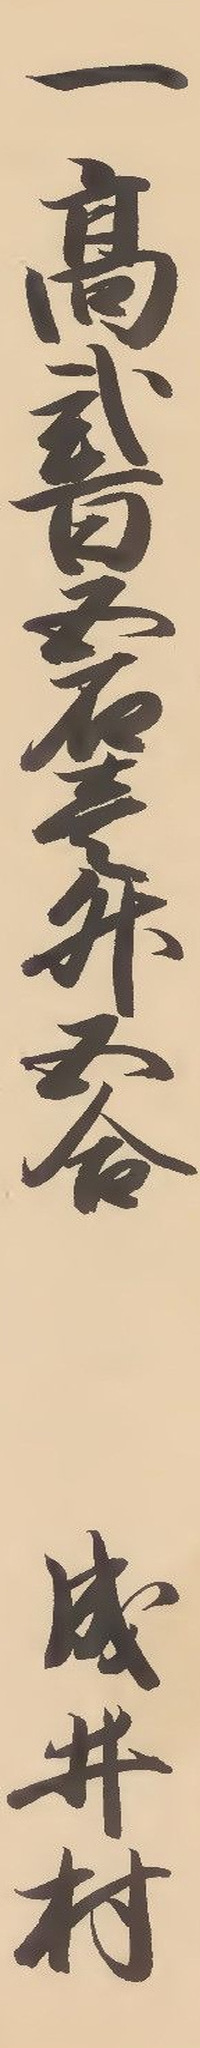一高弐百五石壱升五合成井村
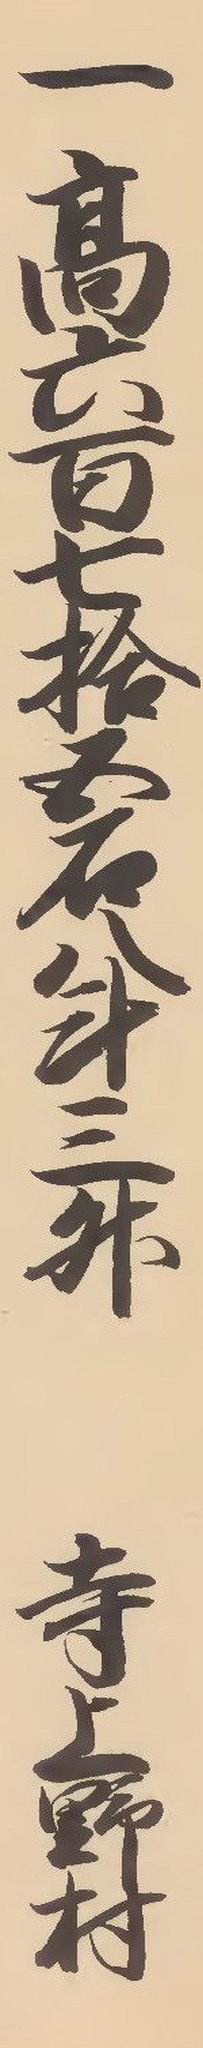一高六百七拾五石八斗三升寺上野村
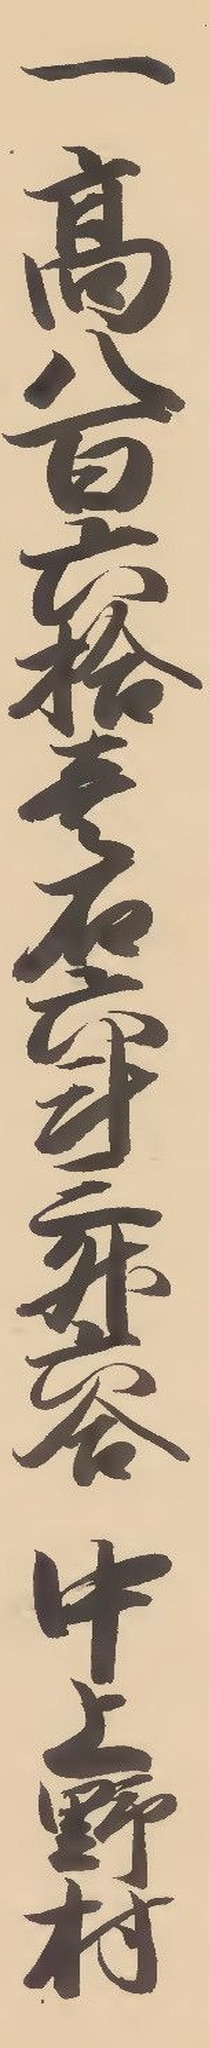一高八百六拾壱石六斗三升六合中上野村
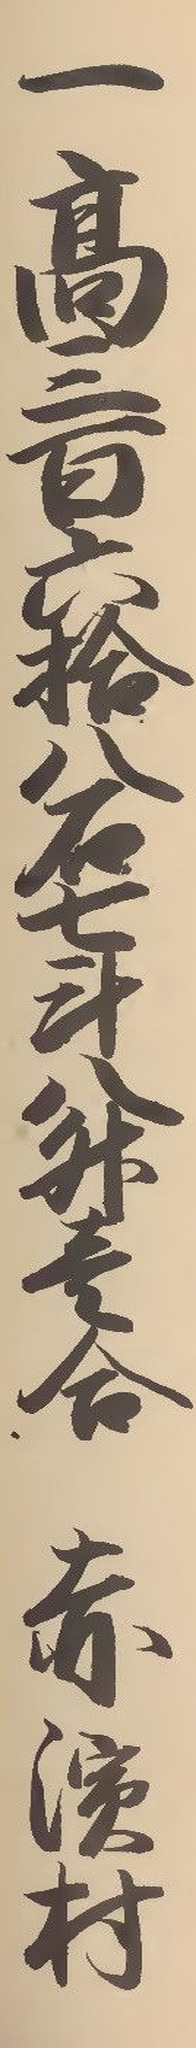一高三百六拾八石七斗八升壱合赤浜村
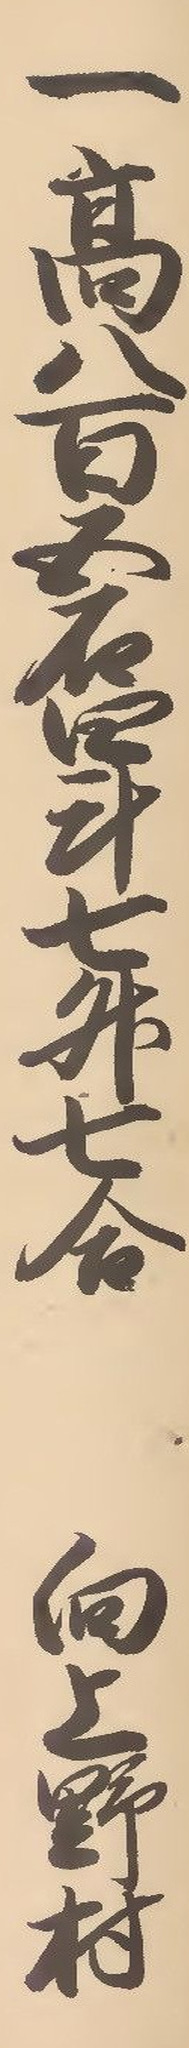一高八百五石四斗七升七合向上野村
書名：常陸国郷帳
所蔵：国立公文書館 National Archives of Japan
